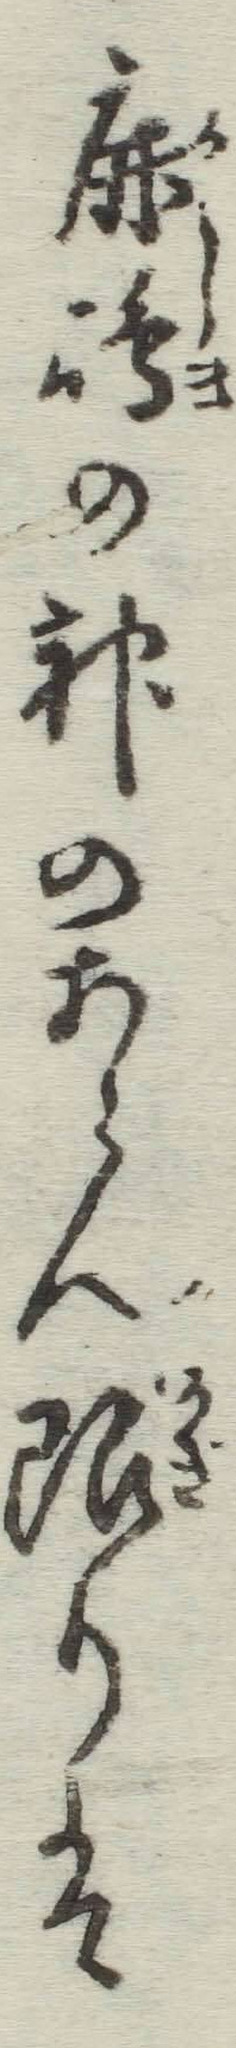鹿島の神のあらん限りは
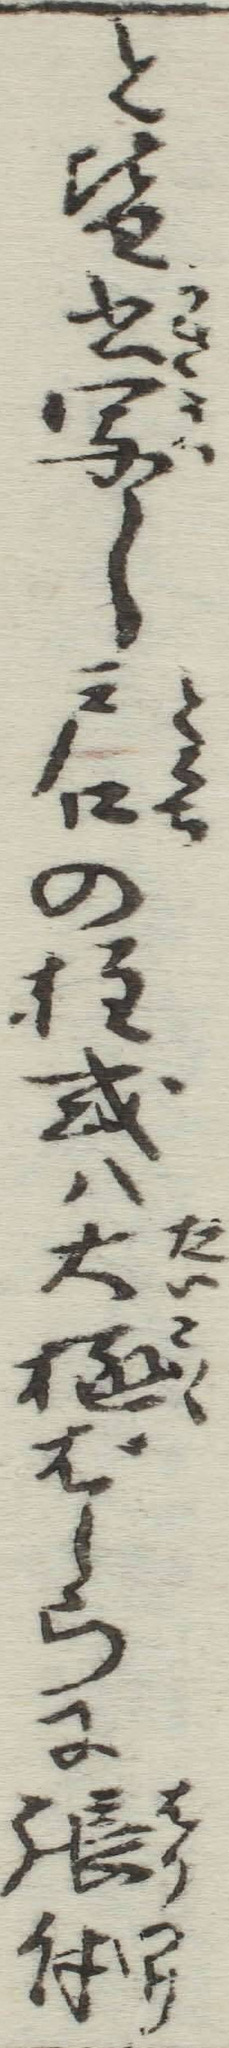と皆書写し戸口の柱或は大極ばしらに張付
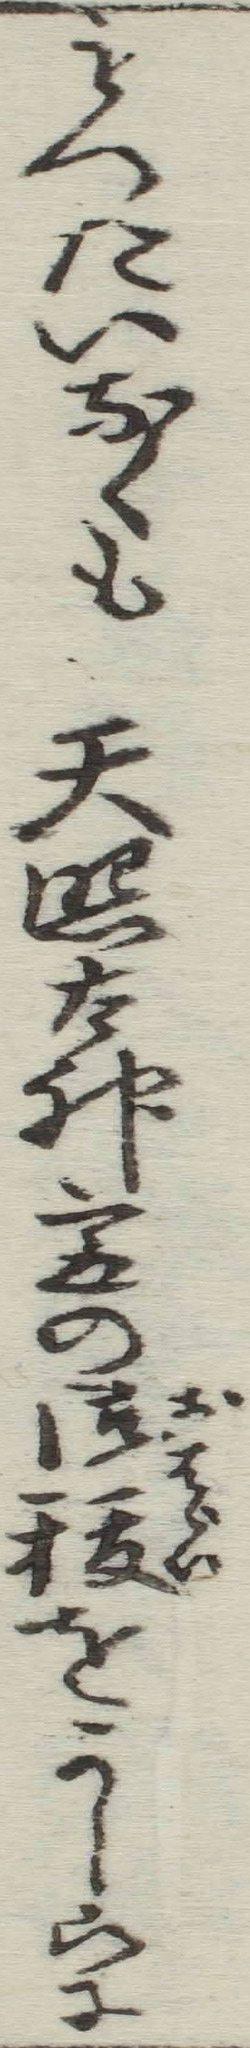もつたいなくも天照大神宮の御祓いをかしらに
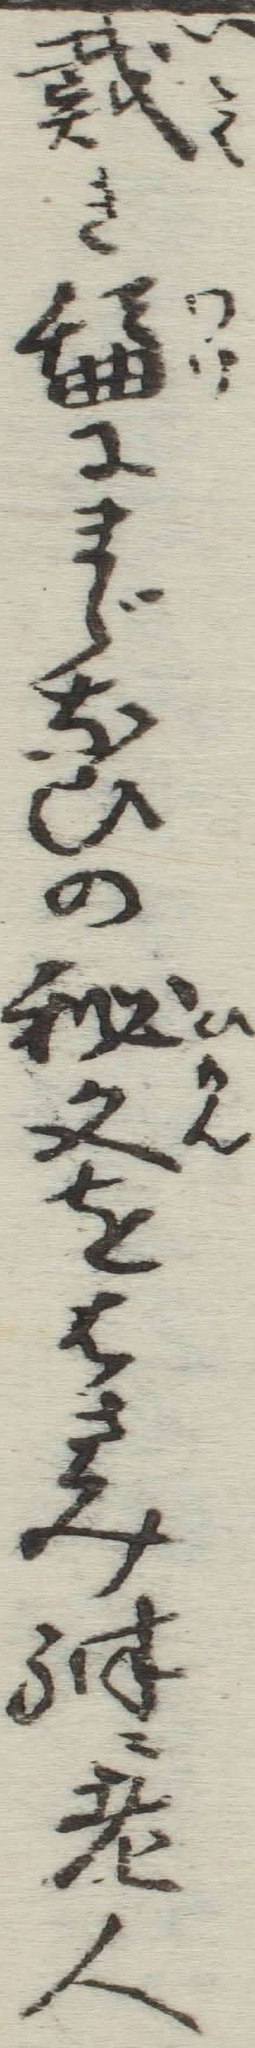戴き髷にまじなひの秘文をはさみ殊に老人
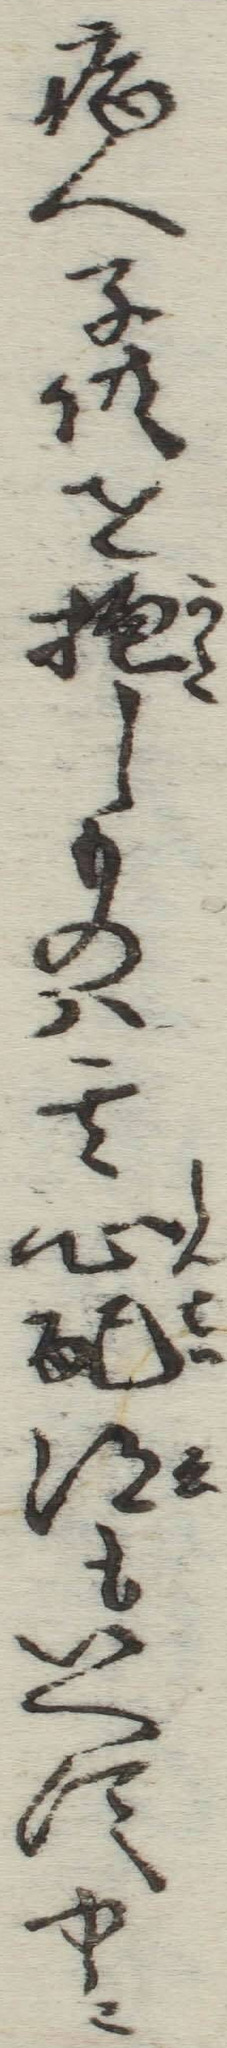病人子供を抱しものは其心配得もいへす中に
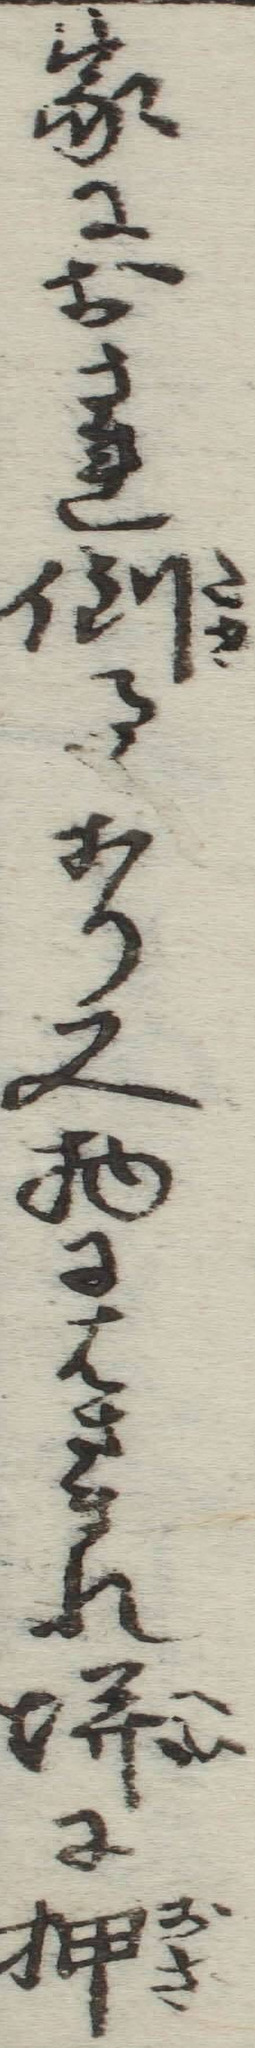家におされ倒るゝあり又物にはさまれ塀に押

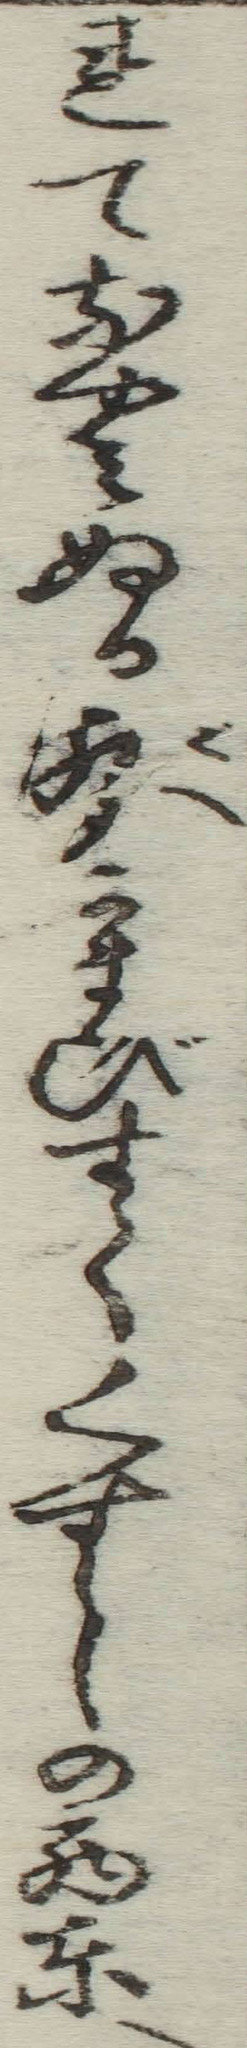れてなやみぬる声かまびすしくくすしの西東へ
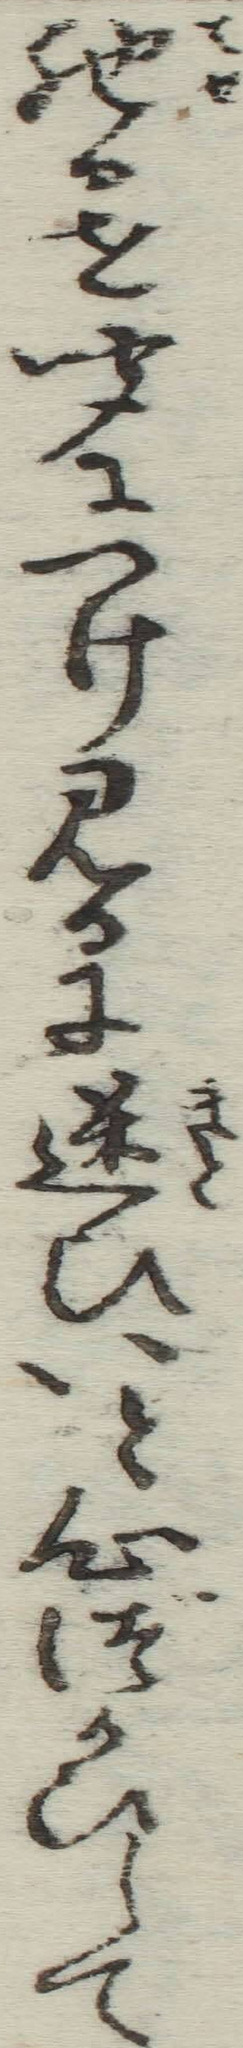馳るを聞につけ見るに迷ひいと心づかひして
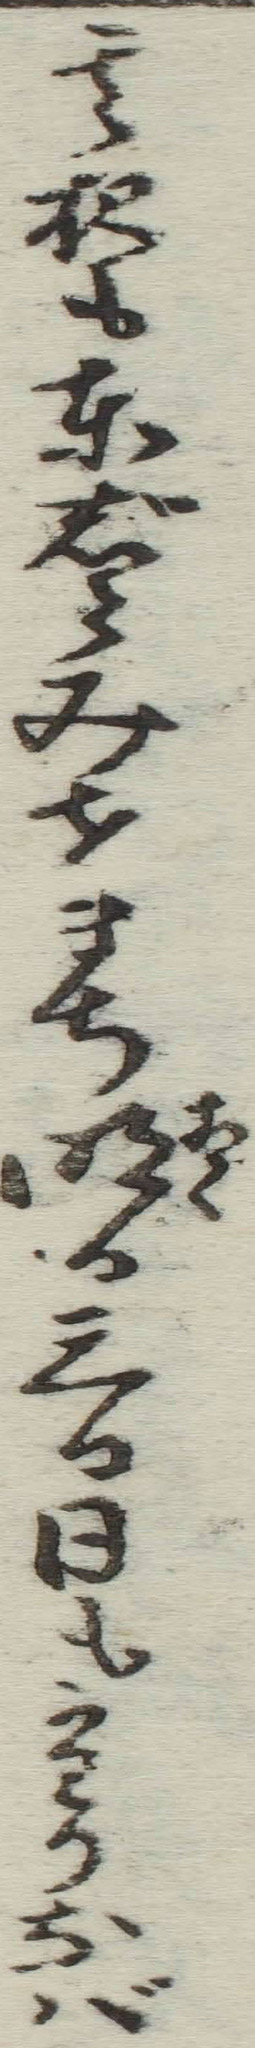其夜も東じらみをまち明る三日日もかわりなば
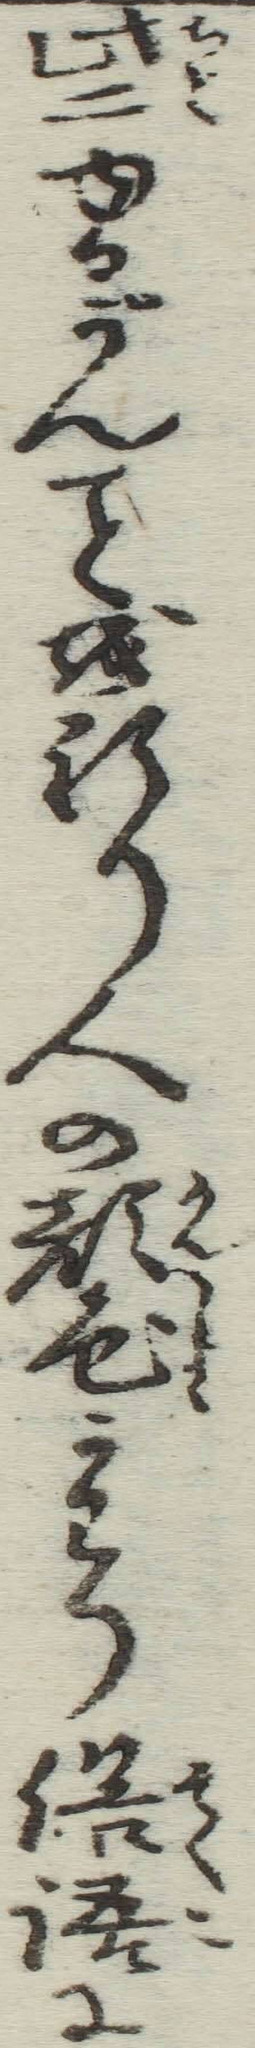些ゆるがんことを祈り人の顔色かわり俗語に
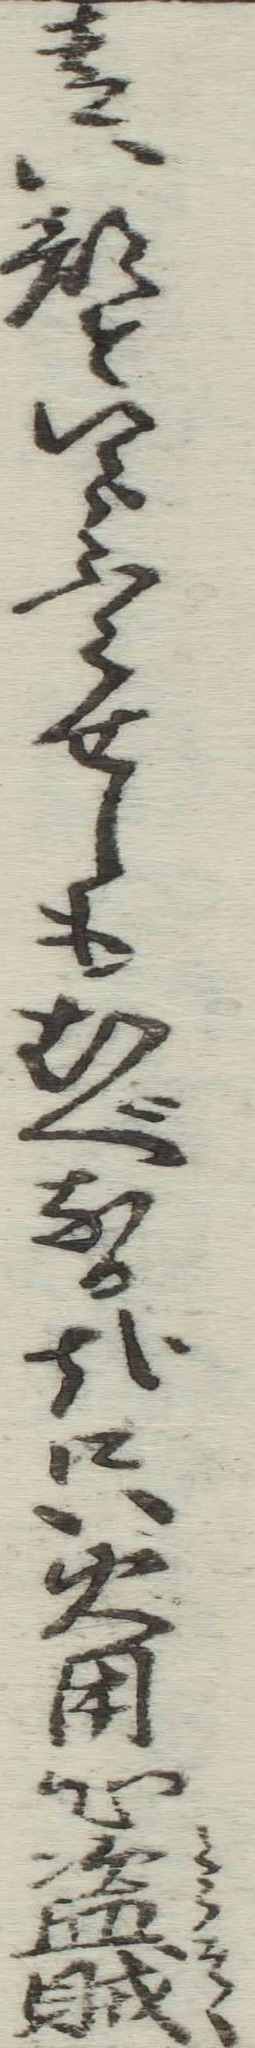青い顔といらふくせしもむべなる哉口は火用心盗賊
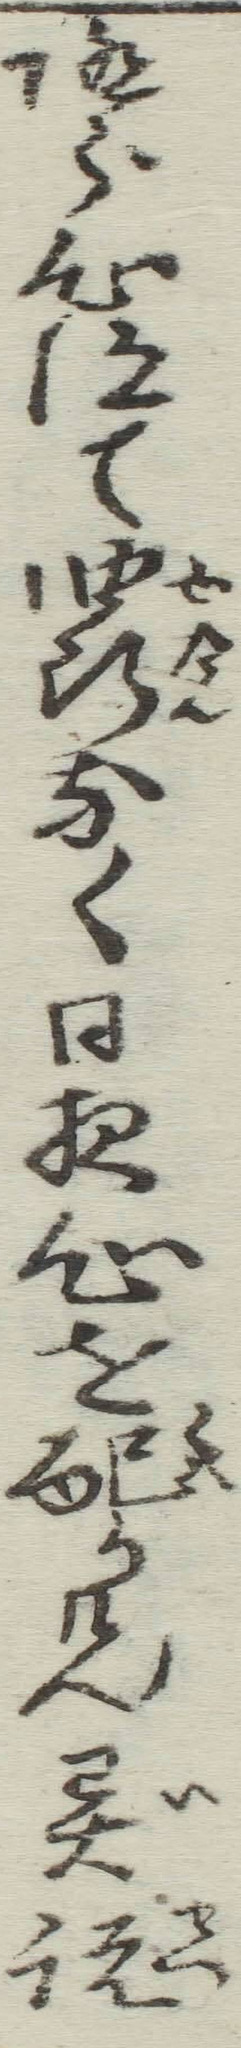随分心得て油断なく日夜心を配りけん異説
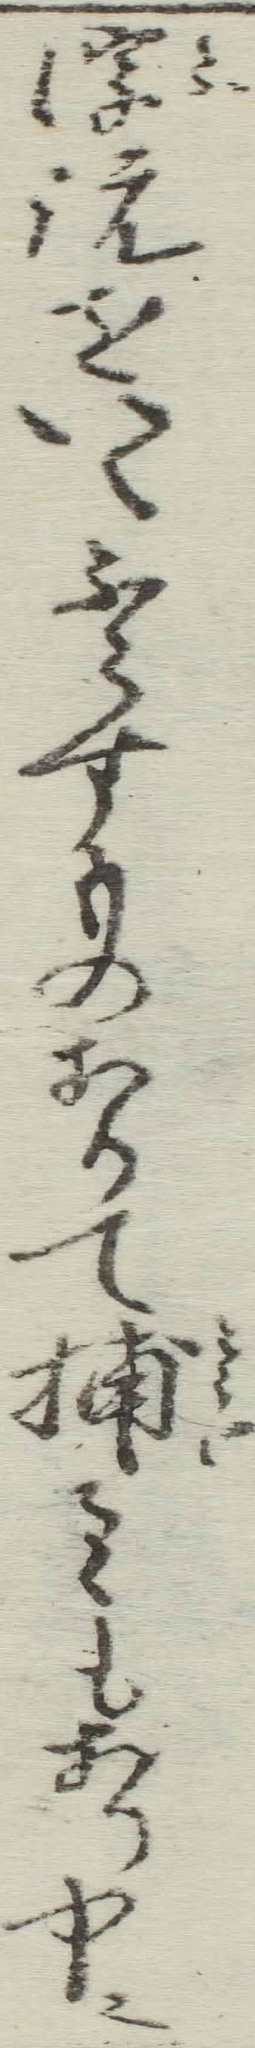浮説をいゝふらすものありて捕るゝもあり中に
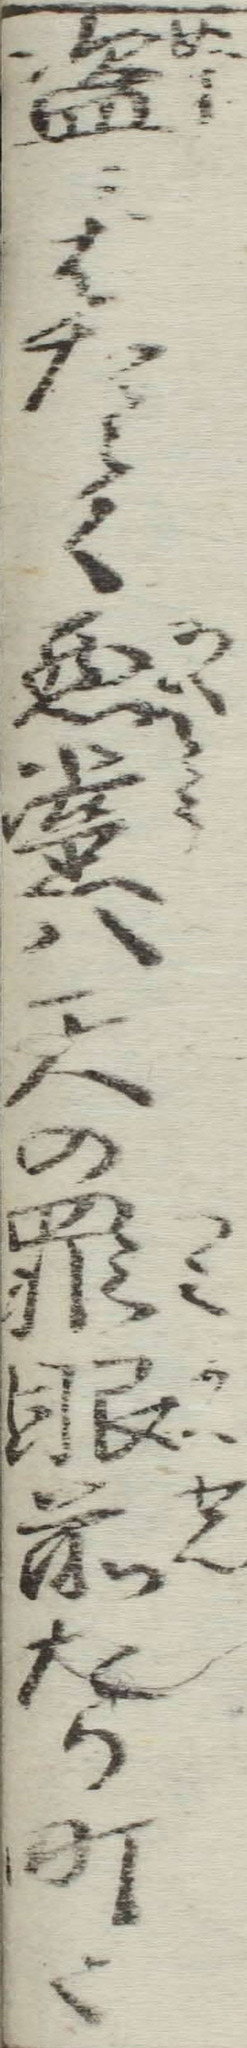盗みはたらく悪党は天の罪眼前たり町々
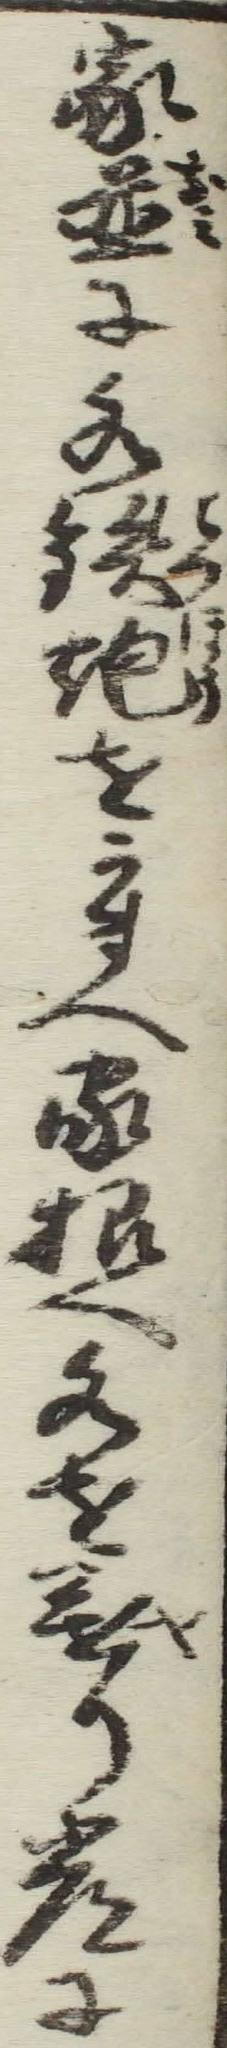家並に水鉄砲をかまへ家根へ水を遣り常に
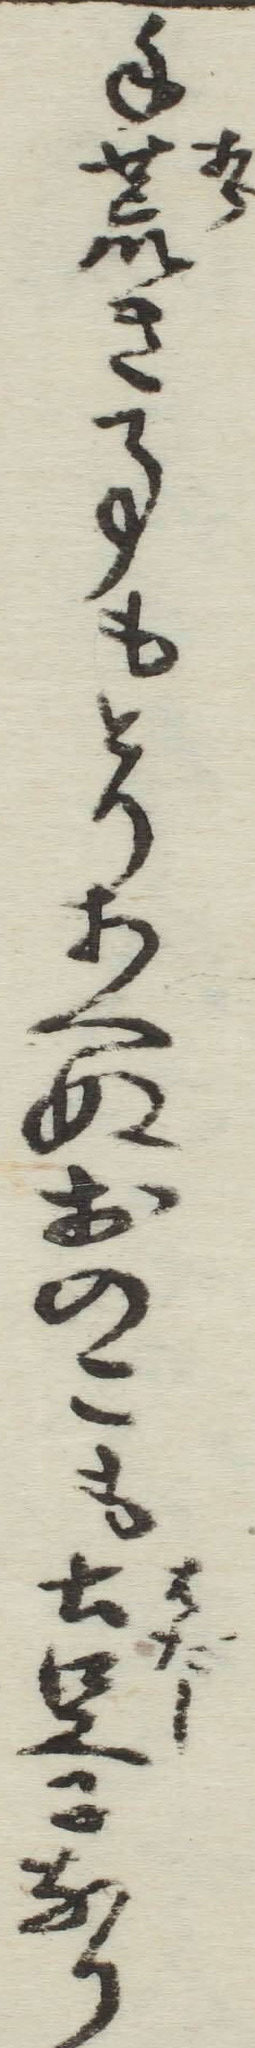手荒き事もとりあつめおのこも土足になり
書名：地震奇談／平安万歳楽
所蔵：国文学研究資料館
